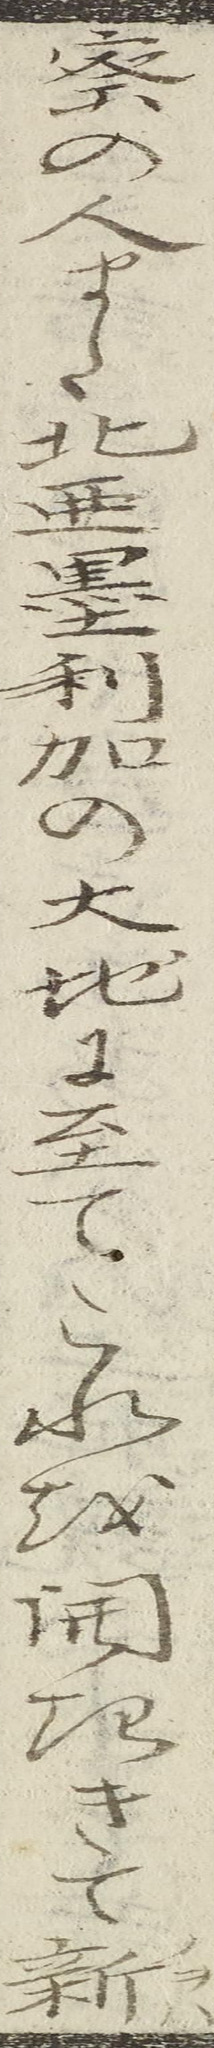察の人また来た亜墨利加の大地に至てこれを開きて新
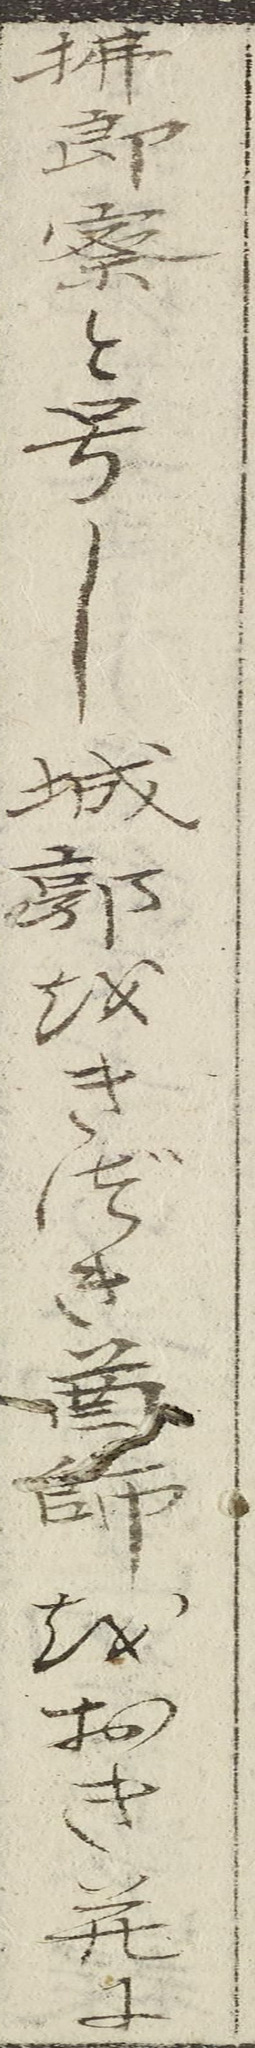拂郎察と号し城郭をきずき酋師をおき并に
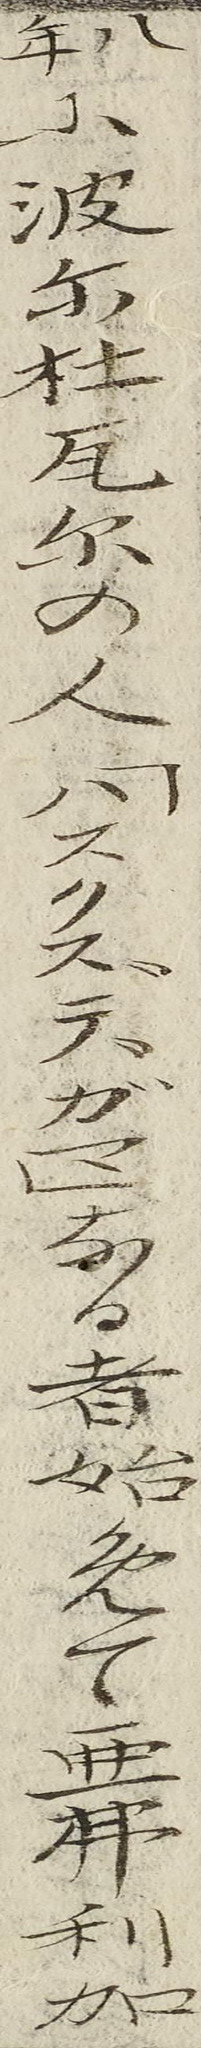八年波尓杜亙尓の人「ハスクス。テ。ガマ」なる者始て亜弗利加
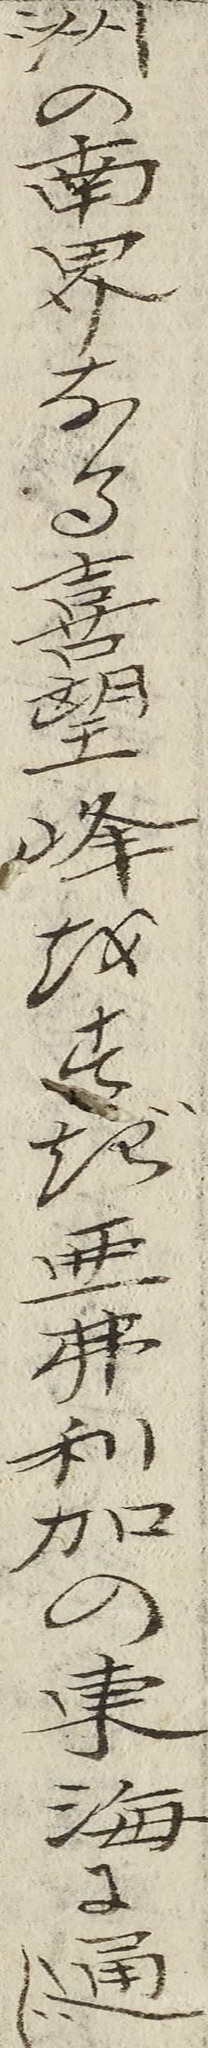洲の南界なる喜望峰をすぎ亜弗利加の東海に通じ
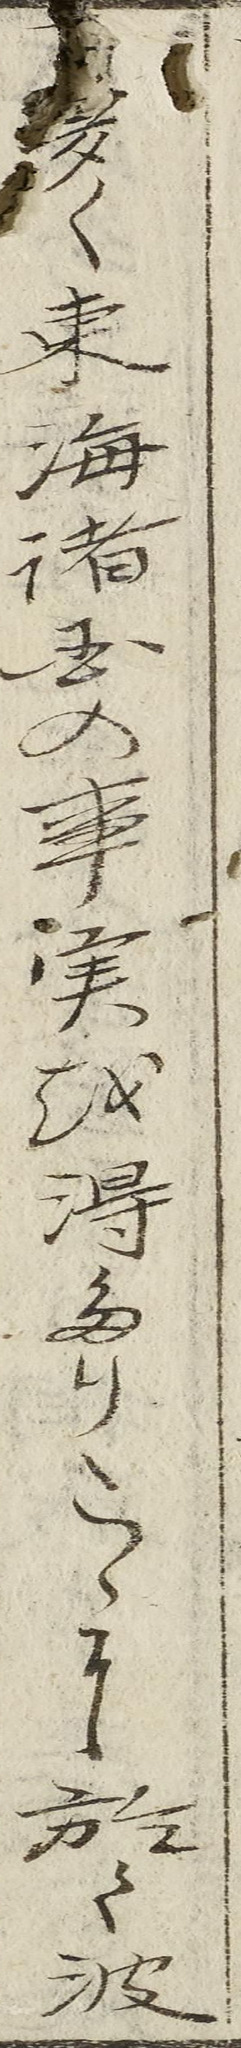て多く東海諸国の事実を得たりこゝに於て波
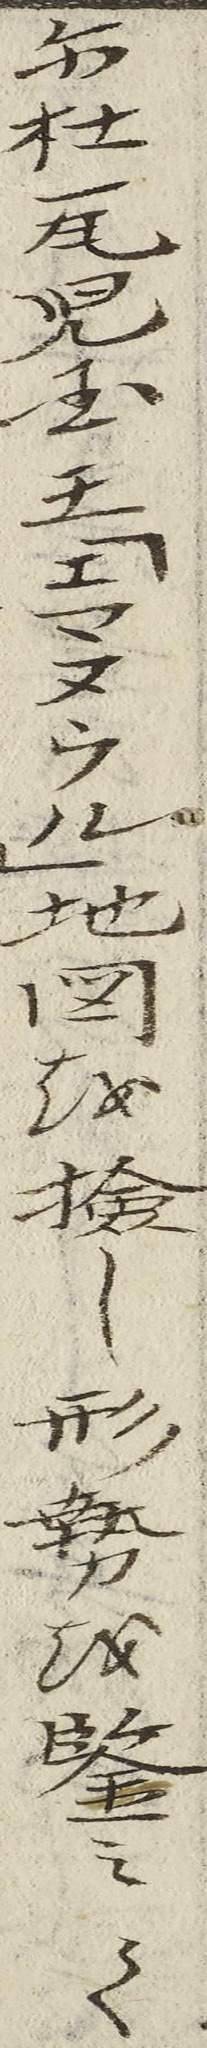尓杜亙児亜国王「エマヌウル」地図を撿し形勢を鍳ミて
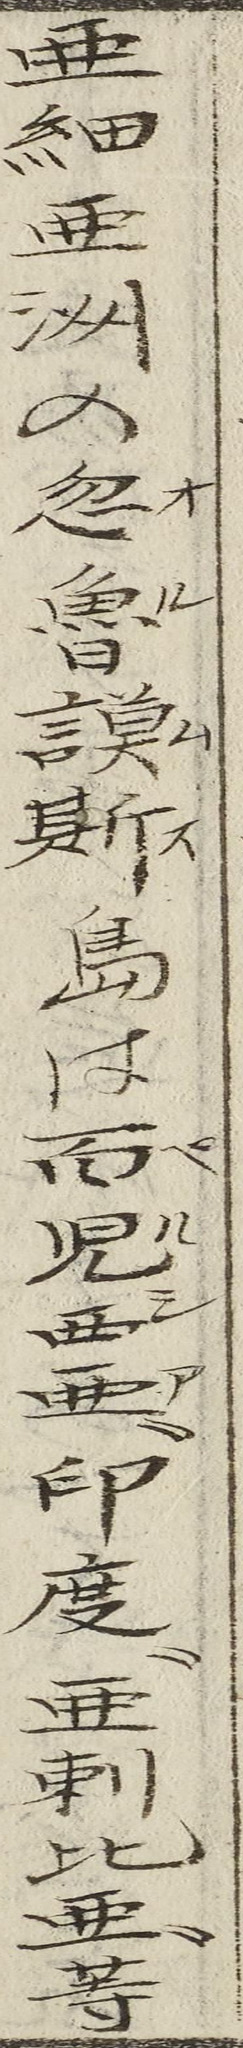亜細亜洲の忽魯謨斯島は而児西亜。印度。亜刺比亜。等
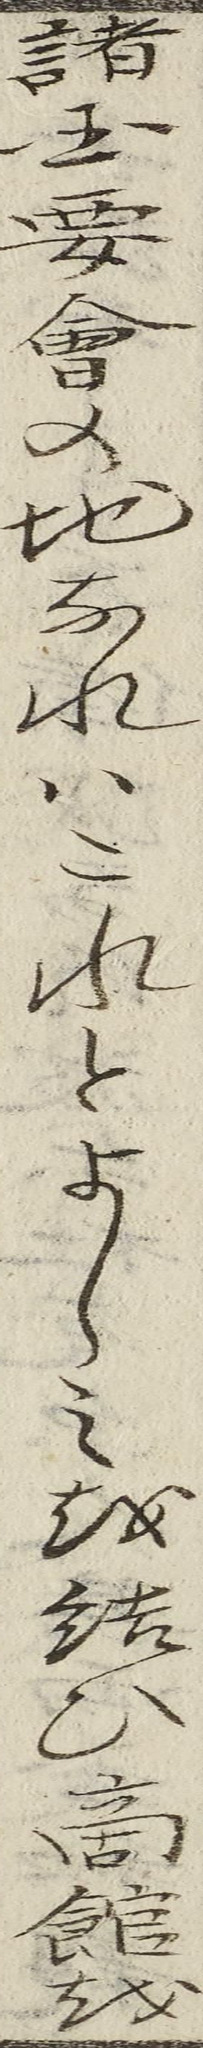諸国要会の地なれハこれとよしミを結ひ商館を
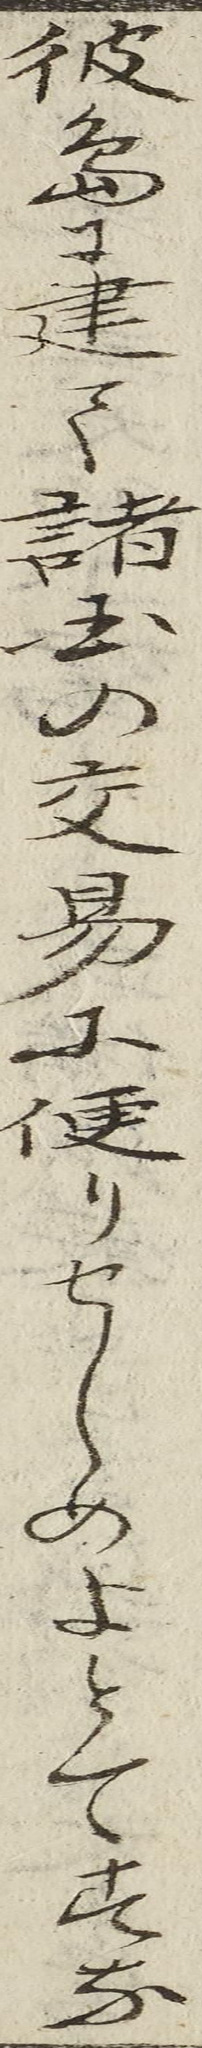彼島に建て諸国の交易に便りせしめよとてすな
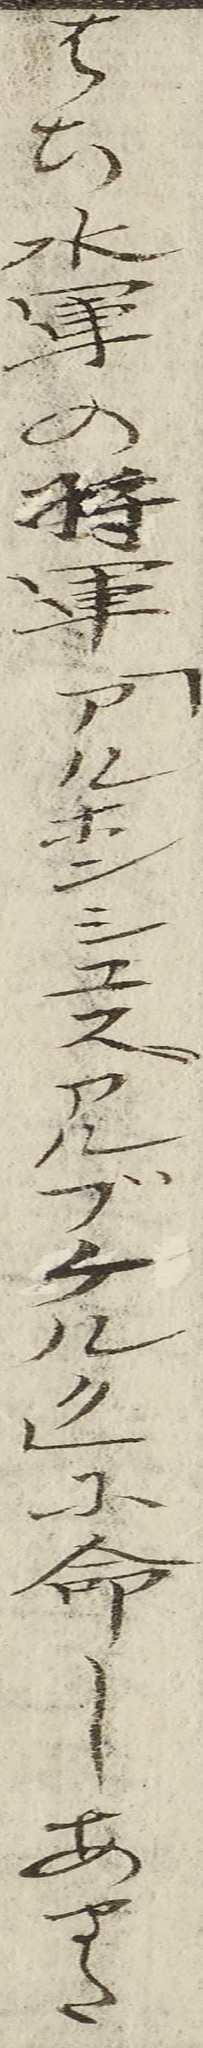はち水軍の将軍「アルホンシュス。アルブケルク」に命しあまた
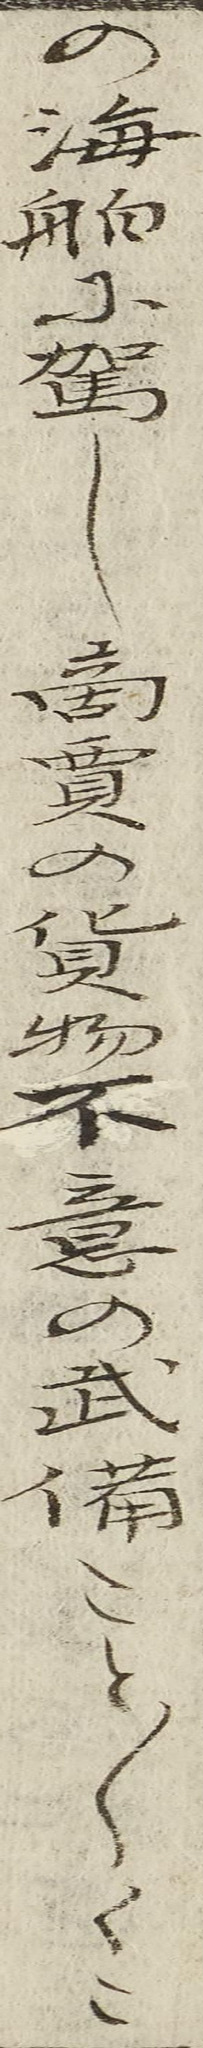の海舶に駕し商売の貨物不意の武備こと〳〵こ
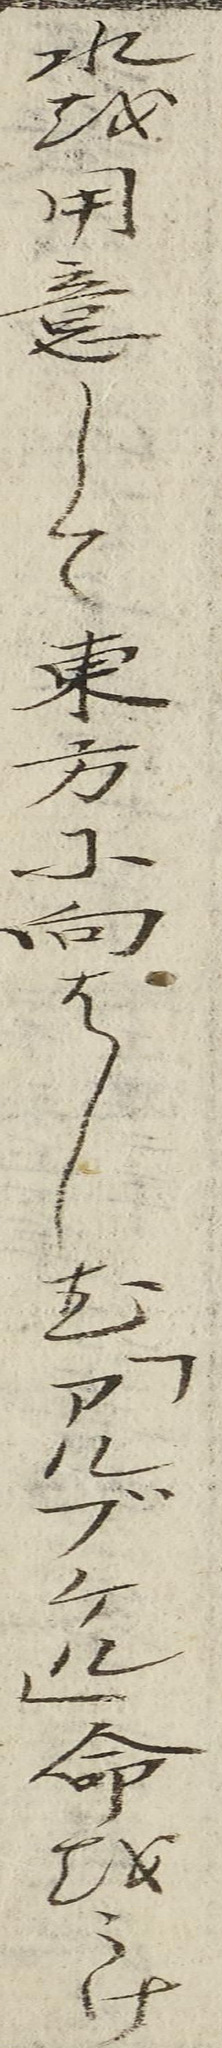れを容意して東方に向はしむ「アンブケる」命をうけ

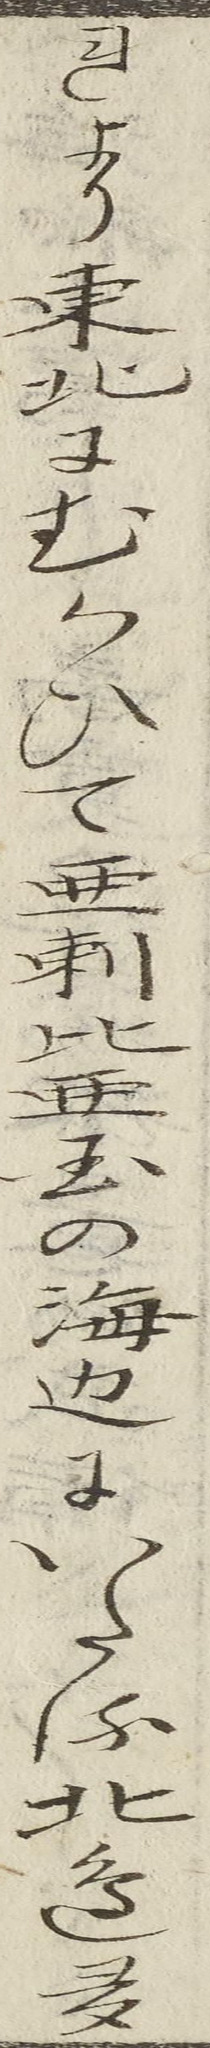れより東北にむかひて亜刺比亜の海辺にいたる北辺多
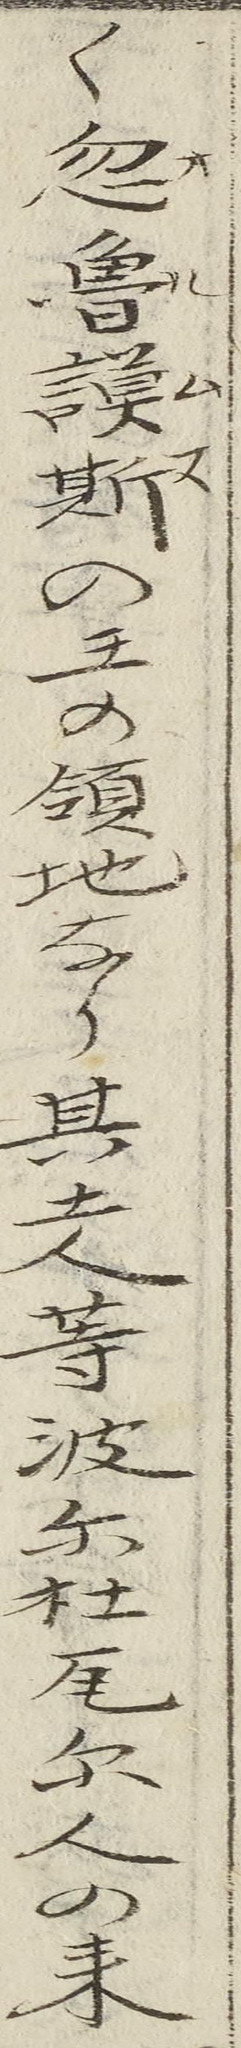く忽魯謨斯の王の領地なり其土人等波尓杜亙尓人の来
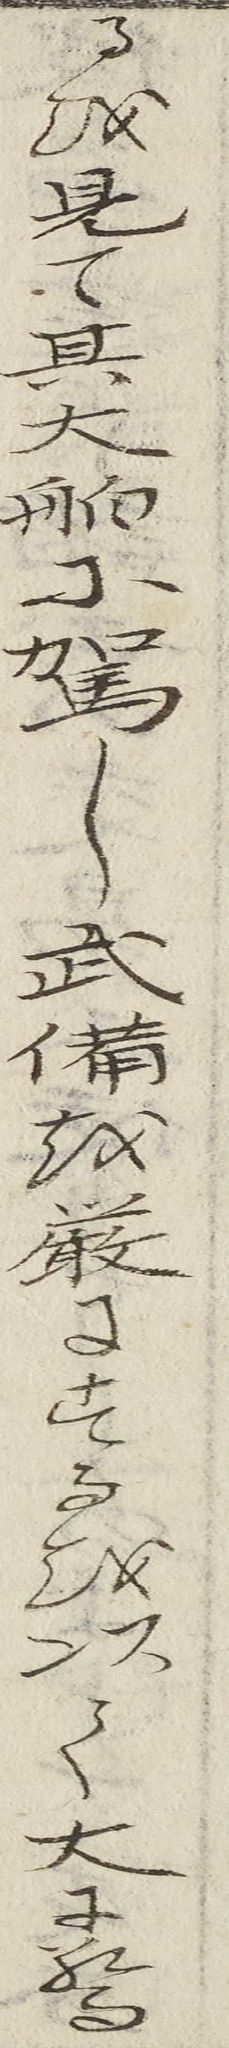るを見て其の大舶に駕し武備厳にするを以て大に驚
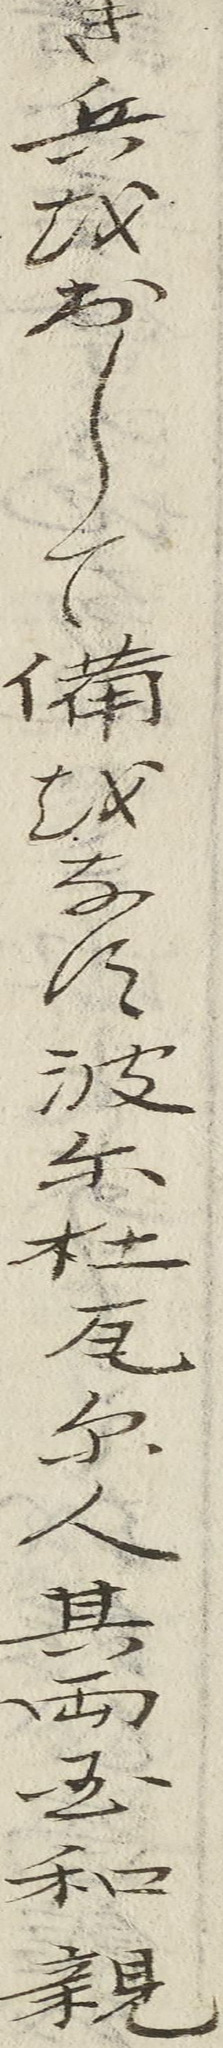き兵を出して備をなす波尓杜亙尓人其両国和親
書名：西洋雜記　乾
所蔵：東京大学地震研究所図書室 Earthquake Research Institute Library, The University of Tokyo, JAPAN
